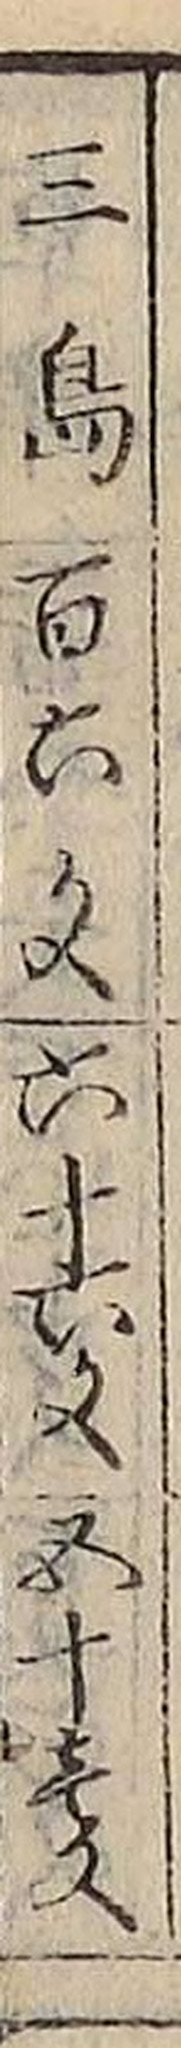三島百六文六十六文五十壱文
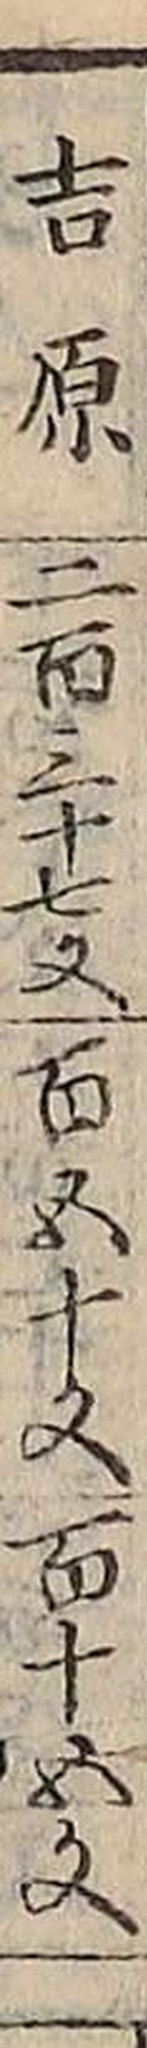吉原二百三十七文百五十文百十五文
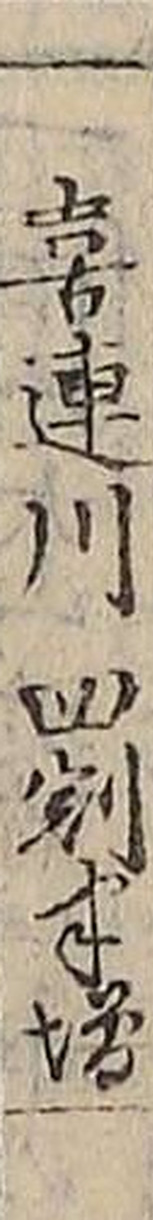喜連川四割半増
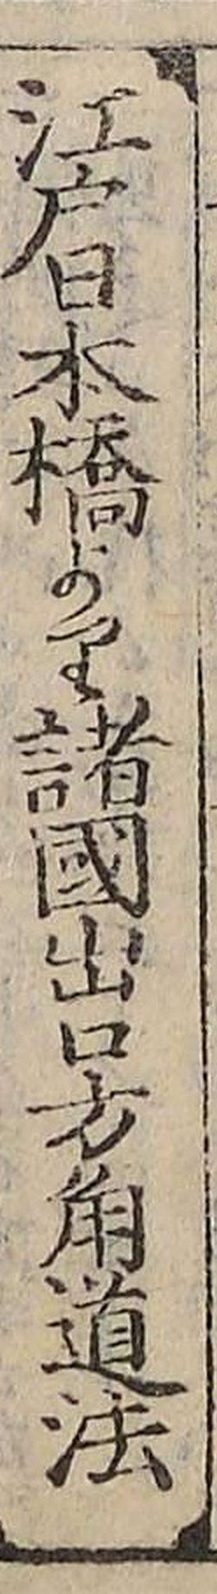江戸日木橋より諸国出口方角道法
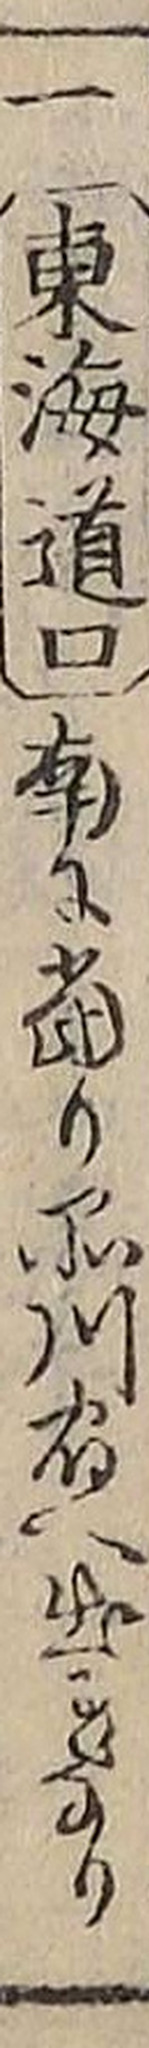一東海道口南に当り品川宿へ出るなり
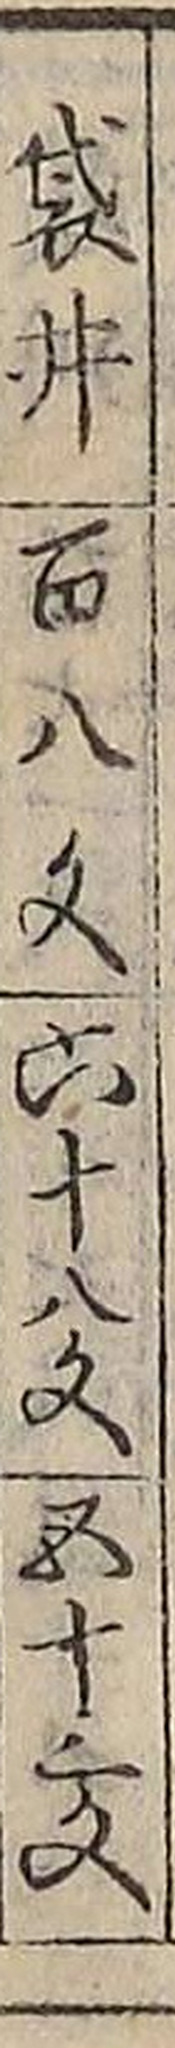袋井百八文六十八文五十三文
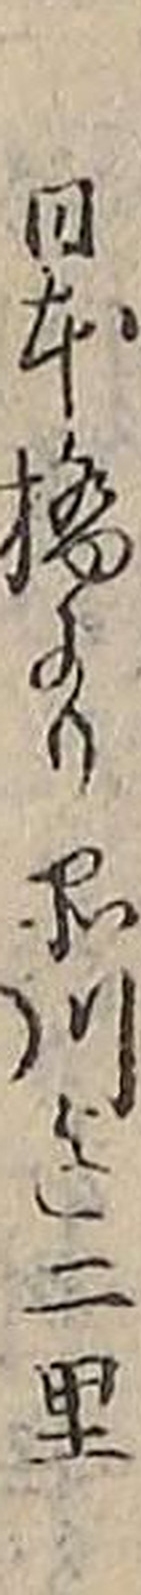日本橋より品川迄二里
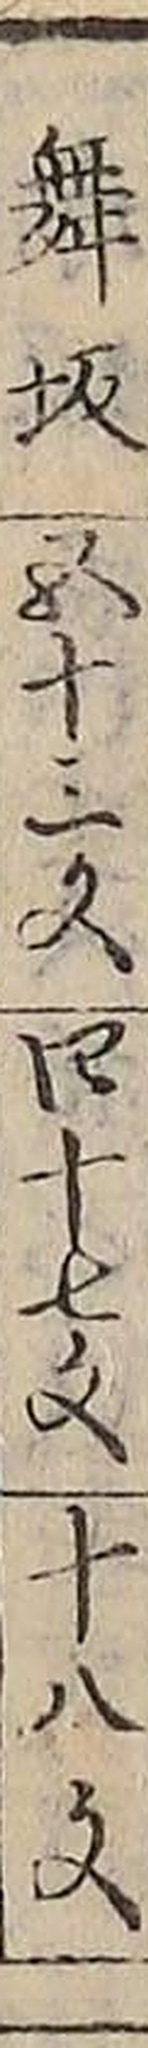舞坂五十三文四十七文十八文
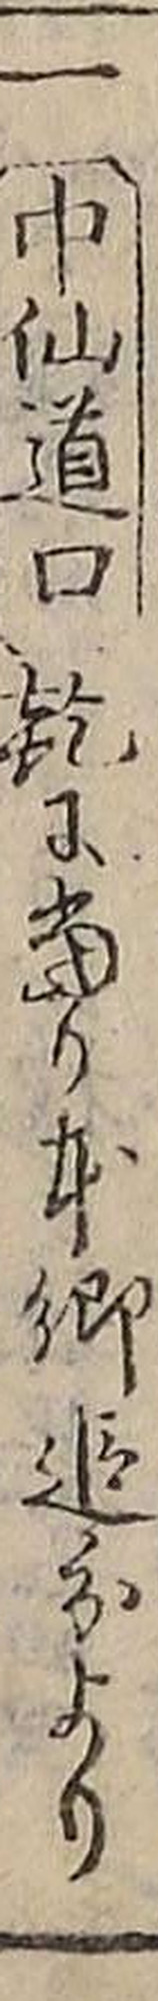一中仙道口乾に当り本郷追分より
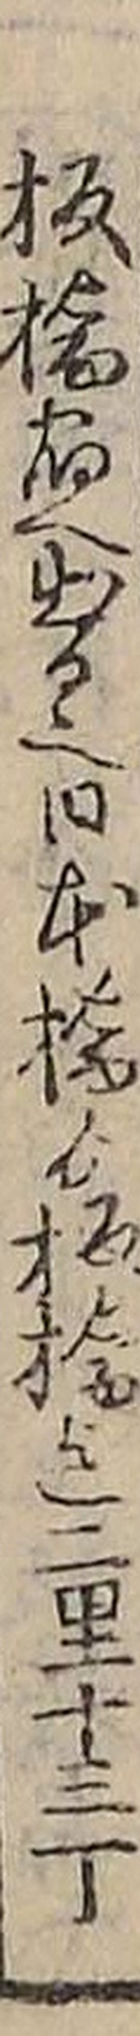板橋宿へ出る也日本橋ゟ板橋迄二里十三丁

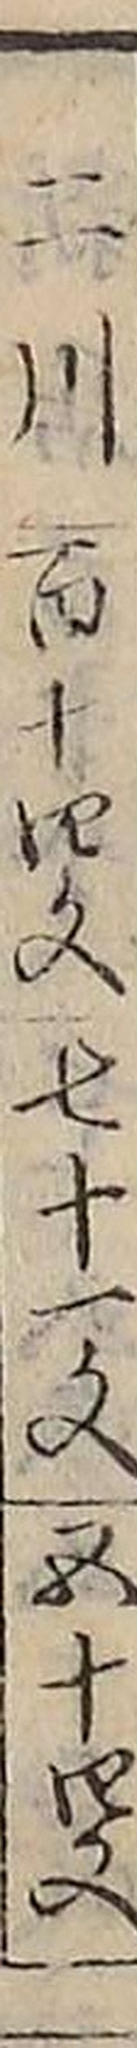二川百十四文七十一文五十四文
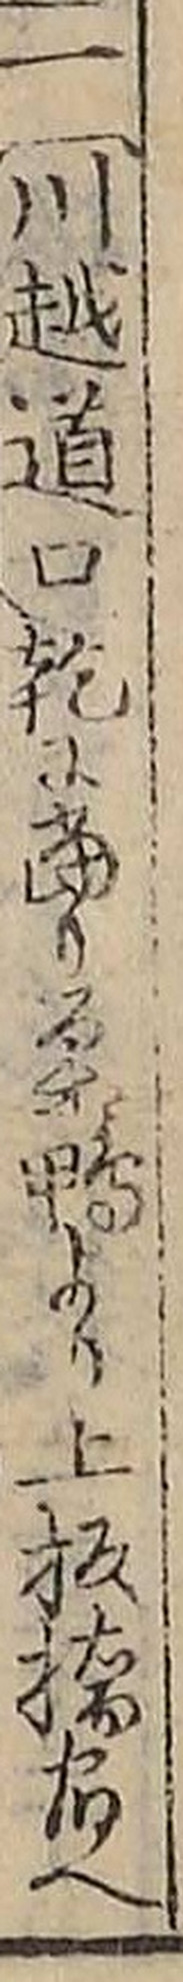一川越道口乾に当り巣鴨より上板橋宿へ
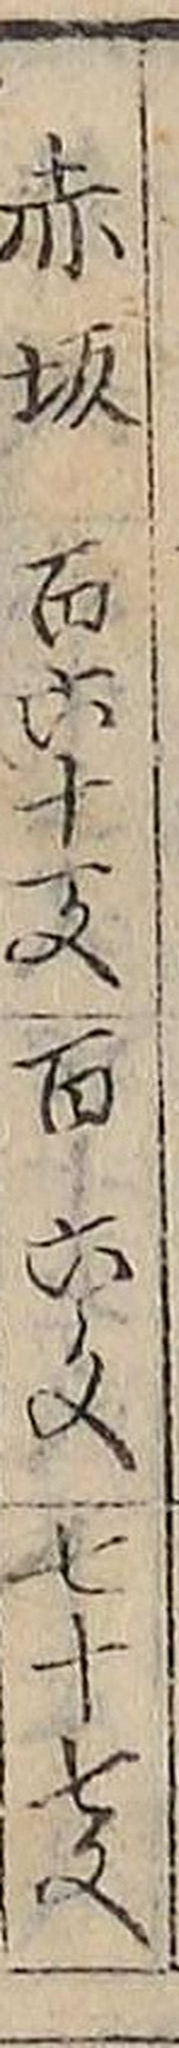赤坂百六十一文百六文七十七文
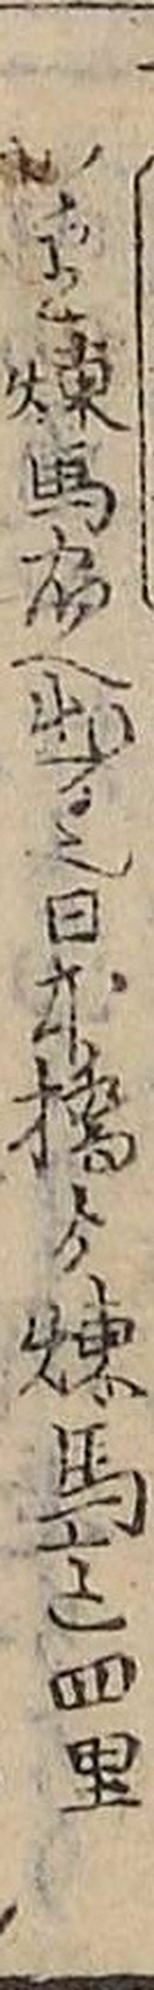煉馬宿へ出る也日本橋ゟ煉馬迄四里
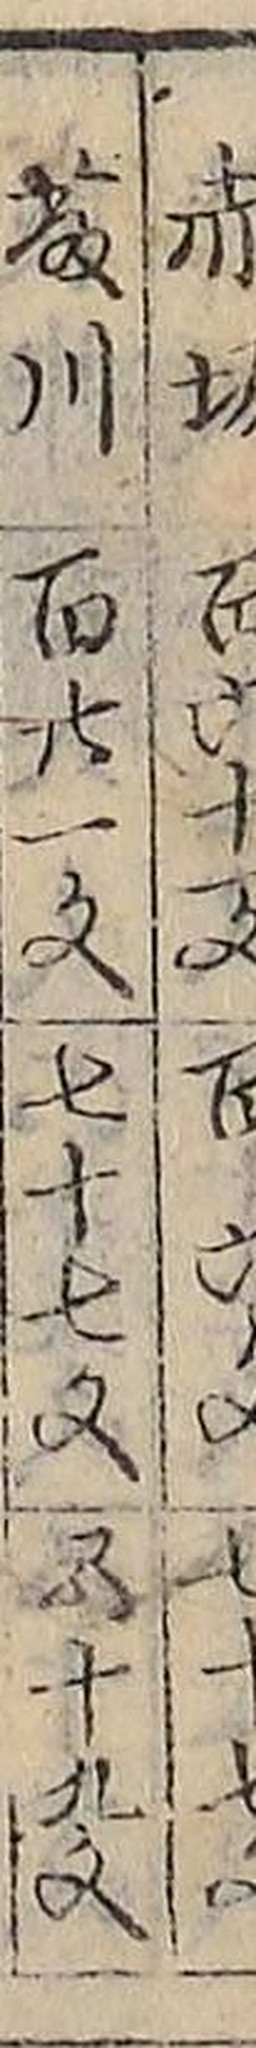藤川百廿一文七十七文五十九文
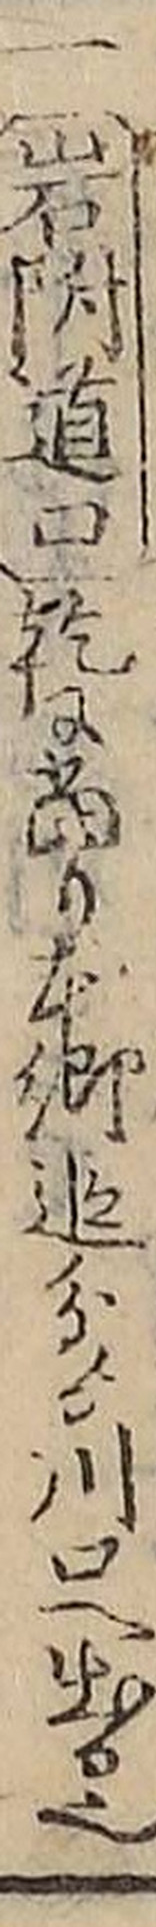一岩附道口乾に当り本郷追分ゟ川口へ出る也
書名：旅行用心集
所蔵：神戸大学附属図書館 国文学研究資料館
